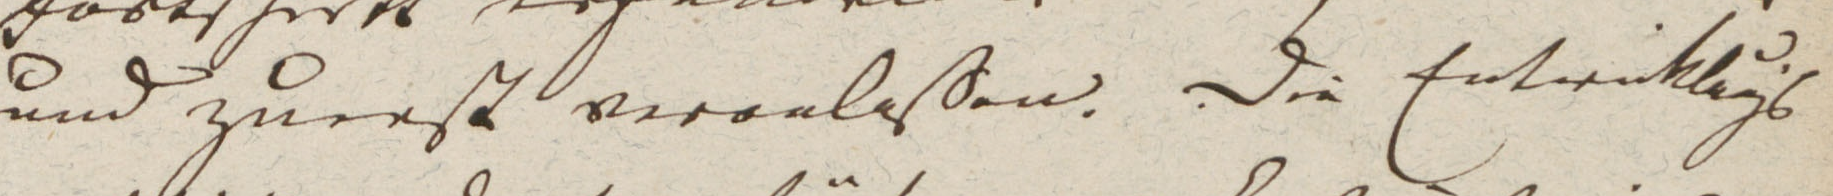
und zuerst veranlassen. Die Entwicklungs
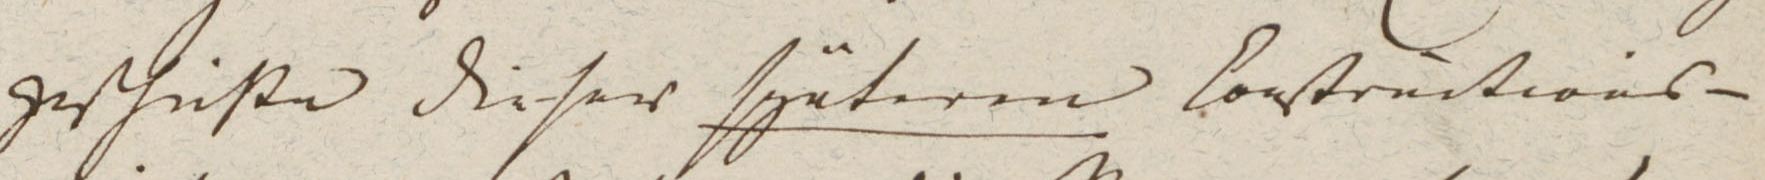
geschichte dieser späteren Constructions-
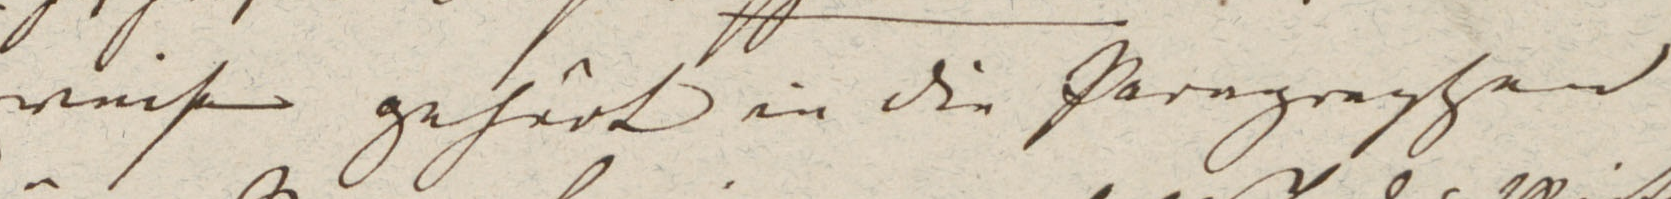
weise gehört in die Paragraphen
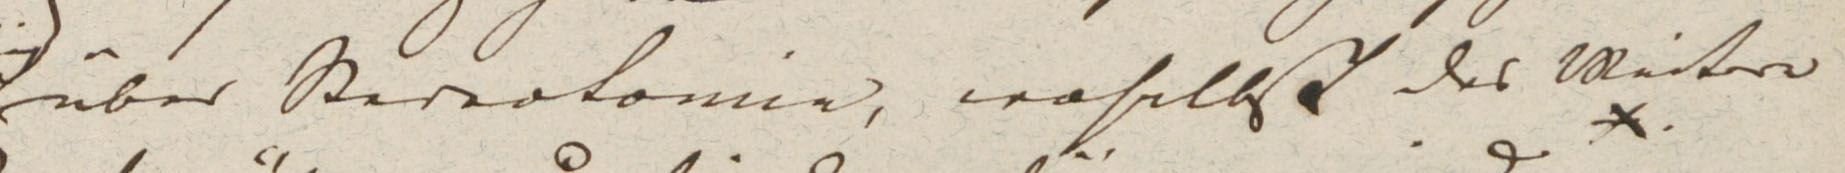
über Stereotomie, woselbst das Weitere
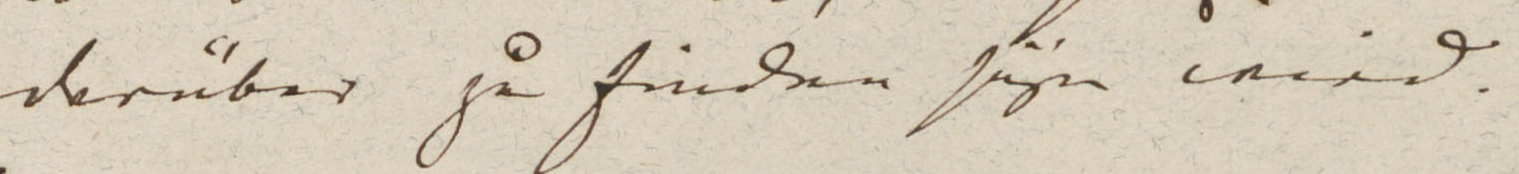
darüber zu finden seyn wird. – %
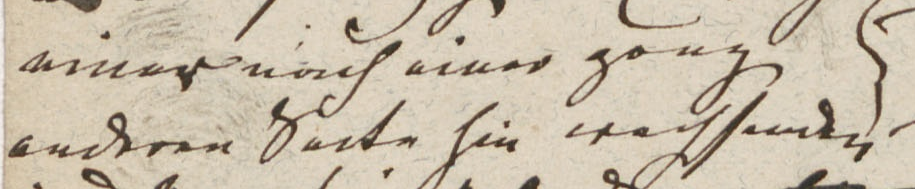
anderen Seite hin wachsenden
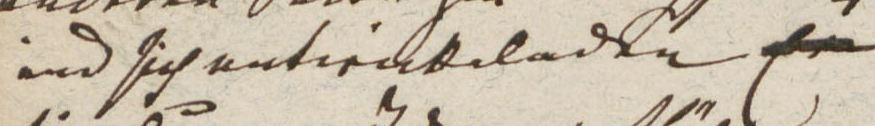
und sich entwickelnden Er
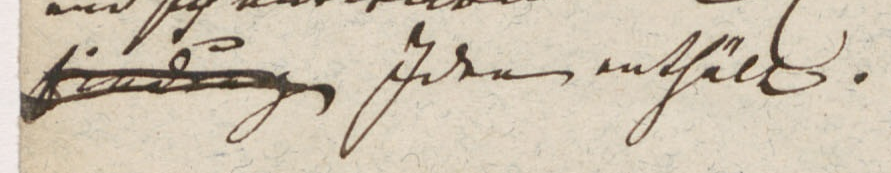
findung Idee enthält.
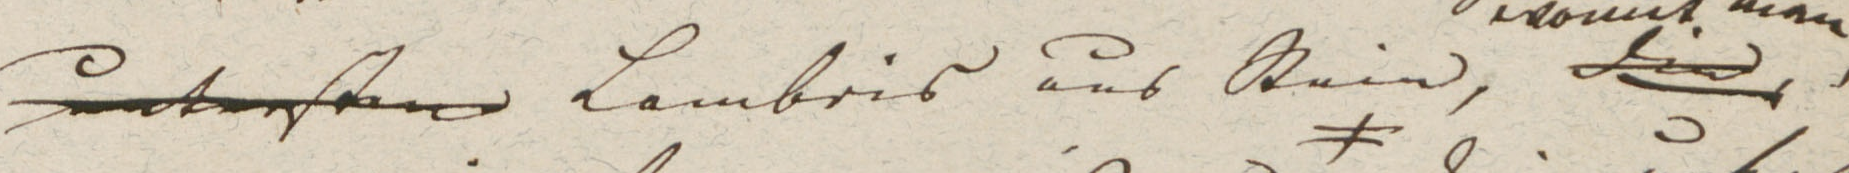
untersten Lambris aus Stein, die,
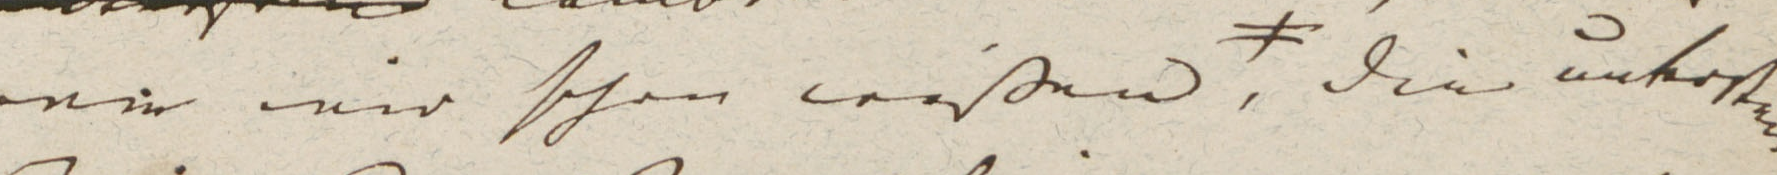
wie wir schon wissen, die untersten
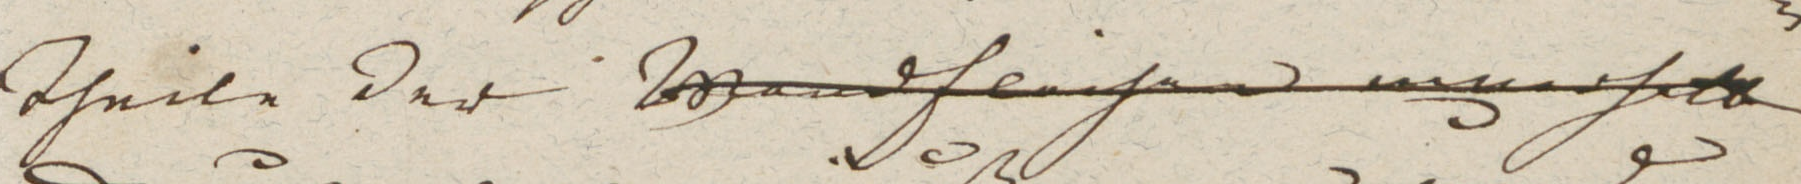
Theile der Wandflächen innerhalb
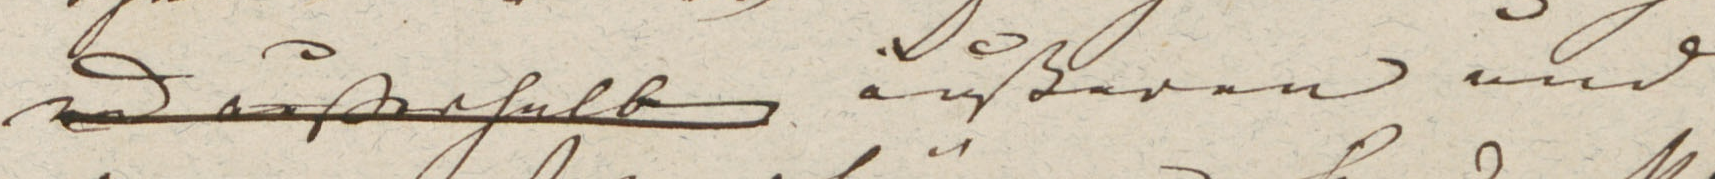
und ausserhalb äusseren und
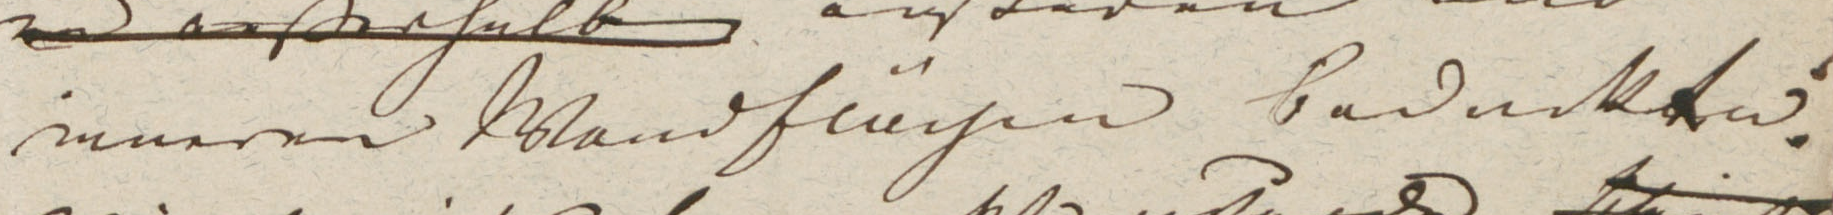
inneren Wandflächen bedeckte
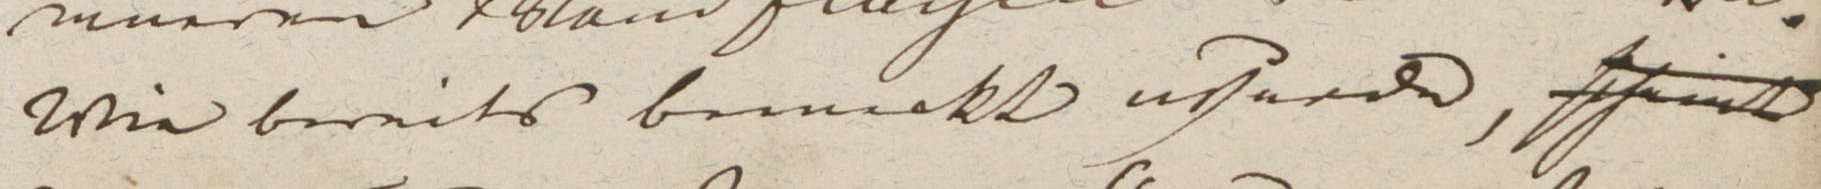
Wie bereits bemerkt wurde, scheint
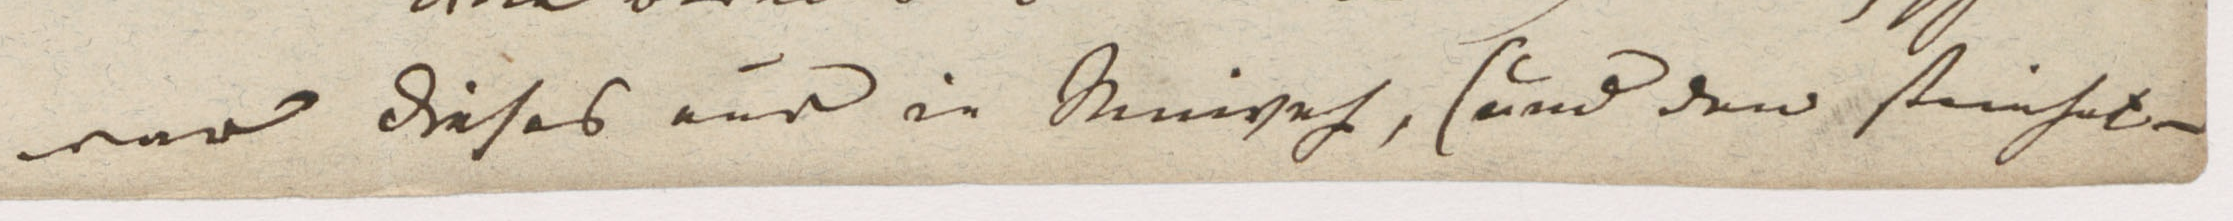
war dieses nur in Niniveh, (und den steinfel-
